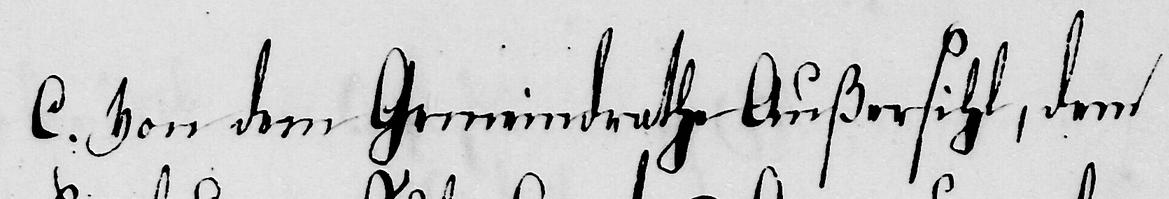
C. Von dem Gemeindrathe Außersihl, dem
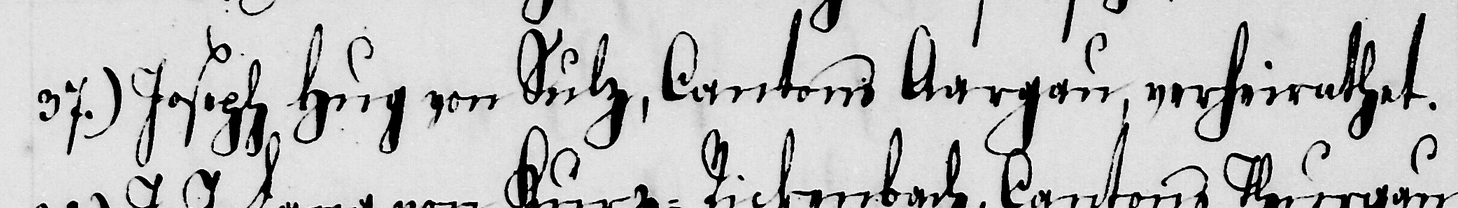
37.) Joseph Hug von Sulz, Cantons Aargau, verheirathet.
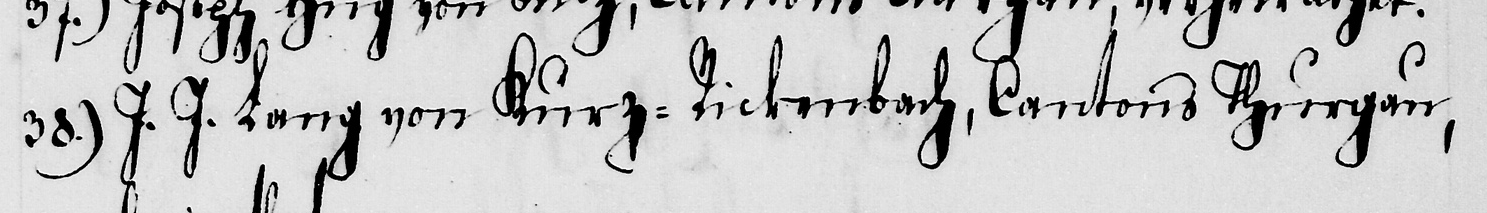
38.) J. J. Lang von Kurz-Rickenbach, Cantons Thurgau,
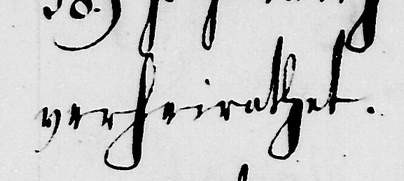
verheirathet.
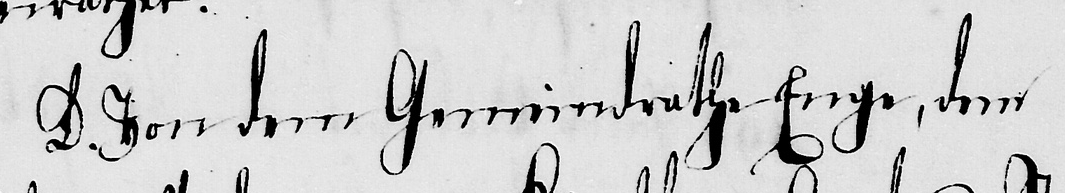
D. Von dem Gemeindrathe Enge, dem
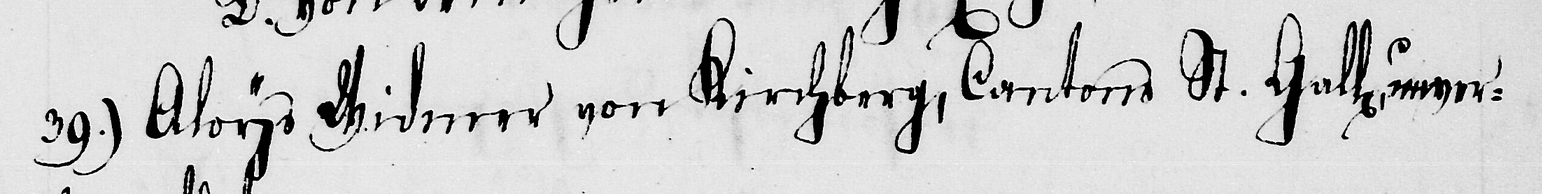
39.) Aloys Widmer von Kirchberg, Cantons St. Gall[en], un¬
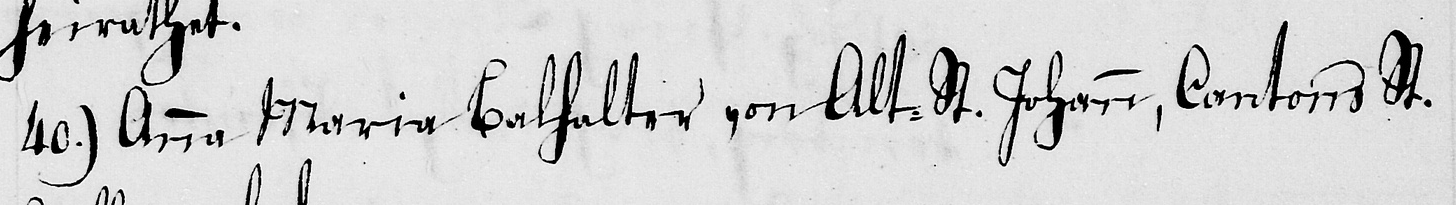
40.) Anna Maria Balhalter von Alt-St. Johann, Cantons St.
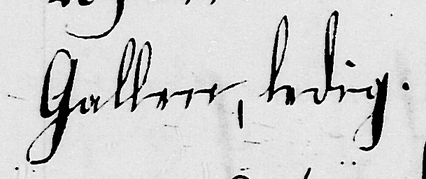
Gallen, ledig.
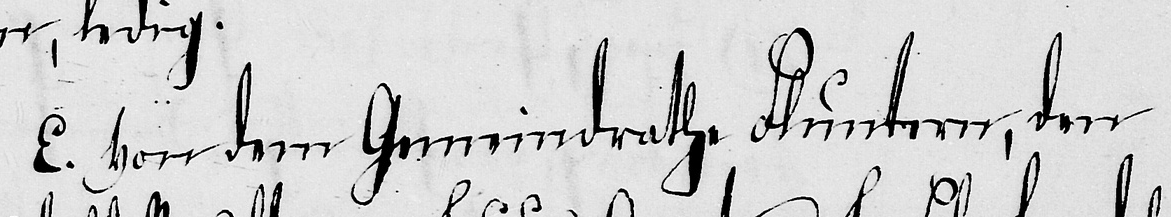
E. Von dem Gemeindrathe Fluntern, den
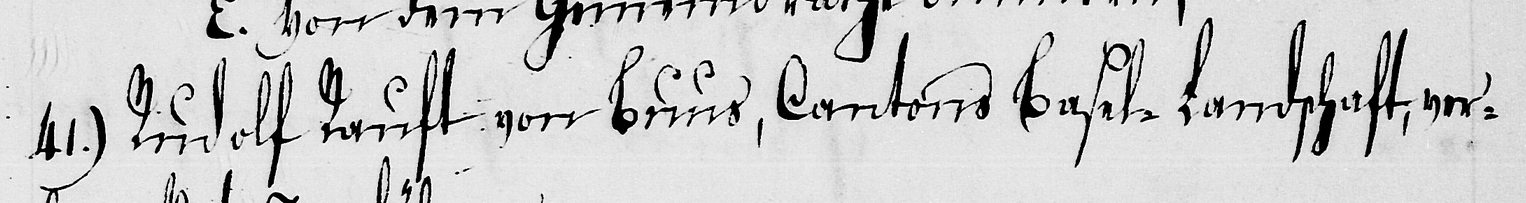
41.) Rudolf Rauft von Buus, Cantons Basel-Landschaft, ver¬
